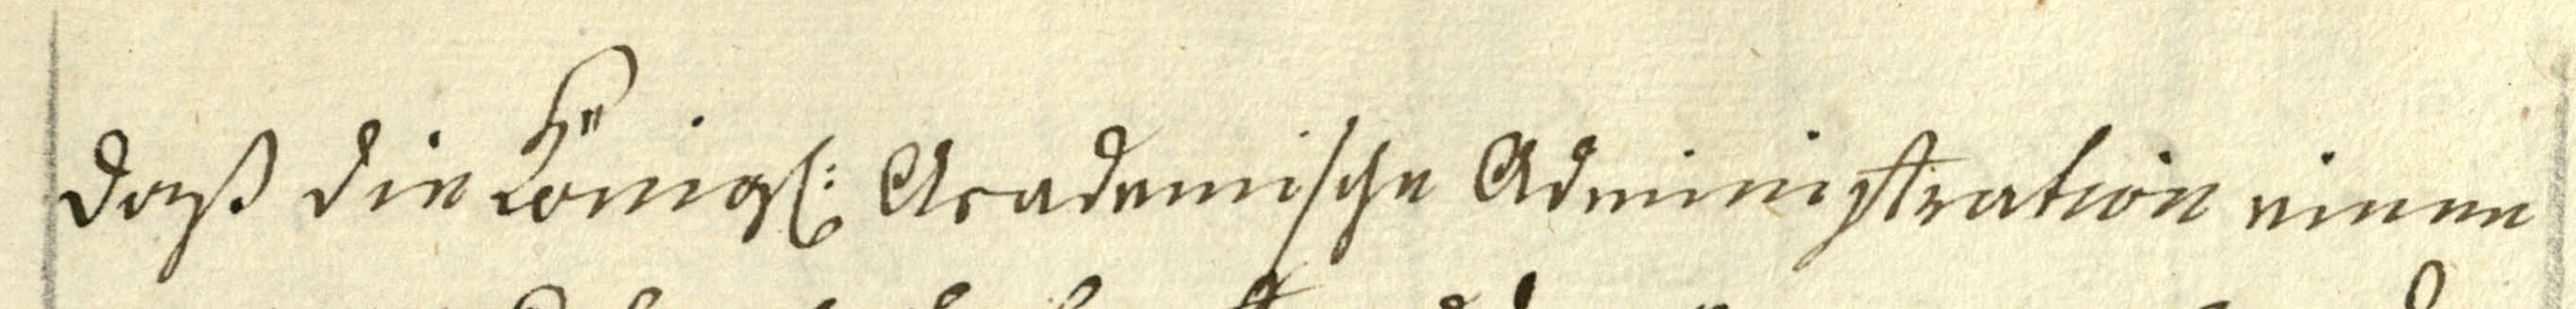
daß die Königl. Academische Administration einen
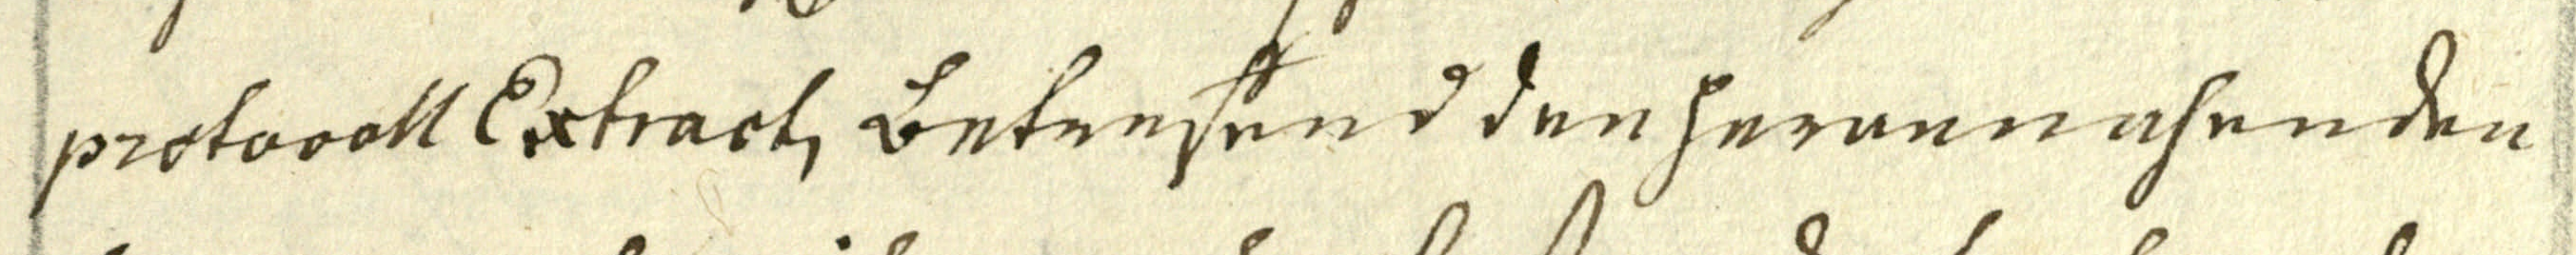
protocoll Extract, betreffend den herannahenden
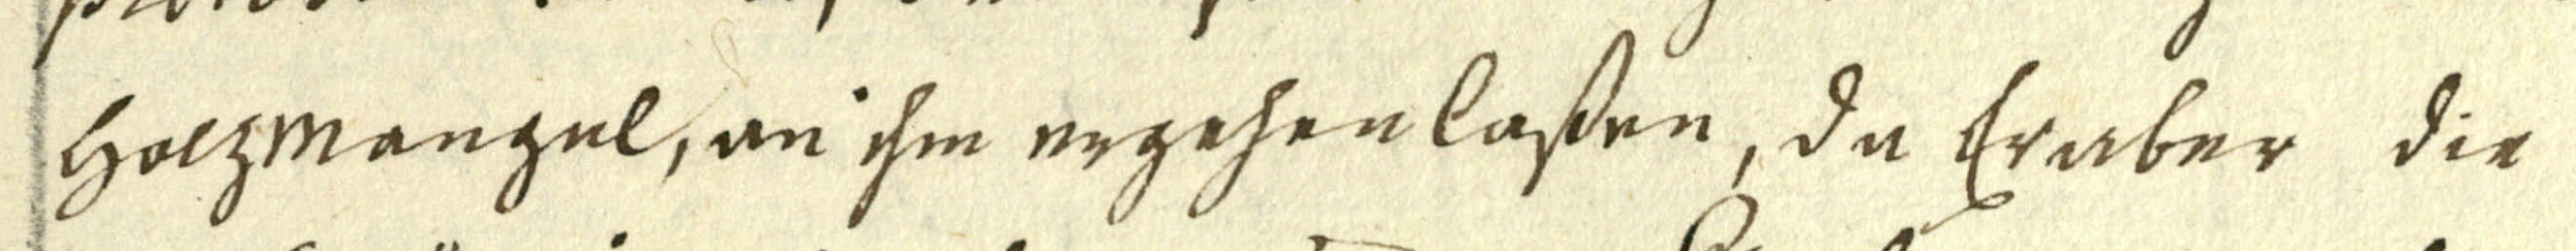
HolzMangel, an ihm ergehen laßen, da Er aber die
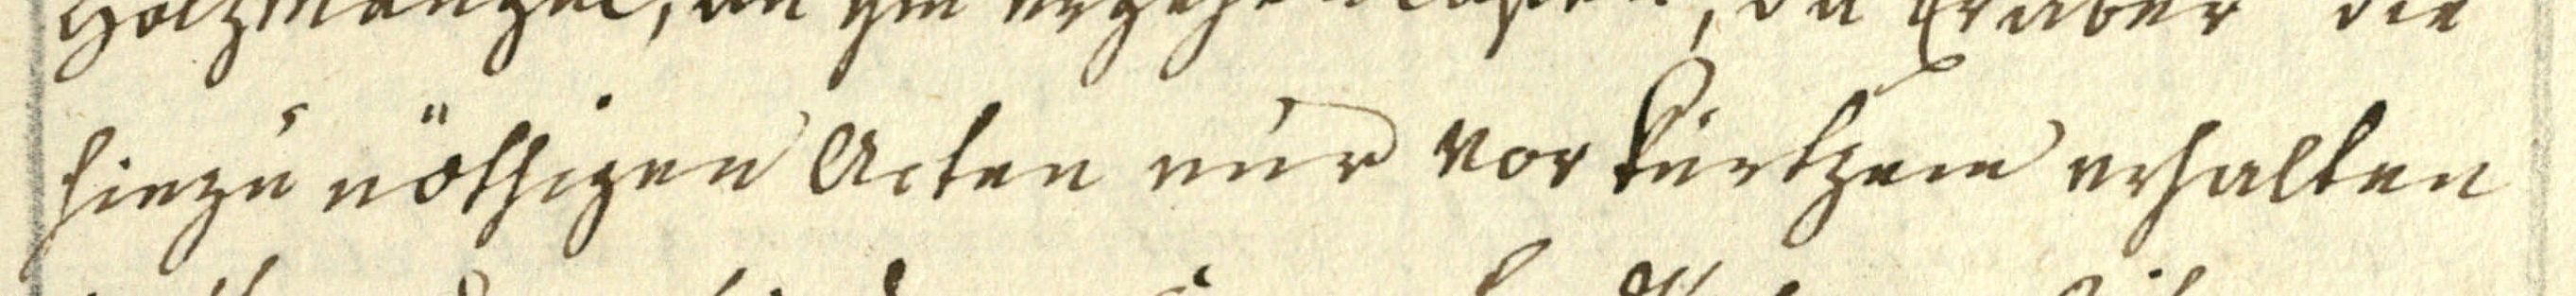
hiezu nöthigen Acten nur vor kurtzem erhalten
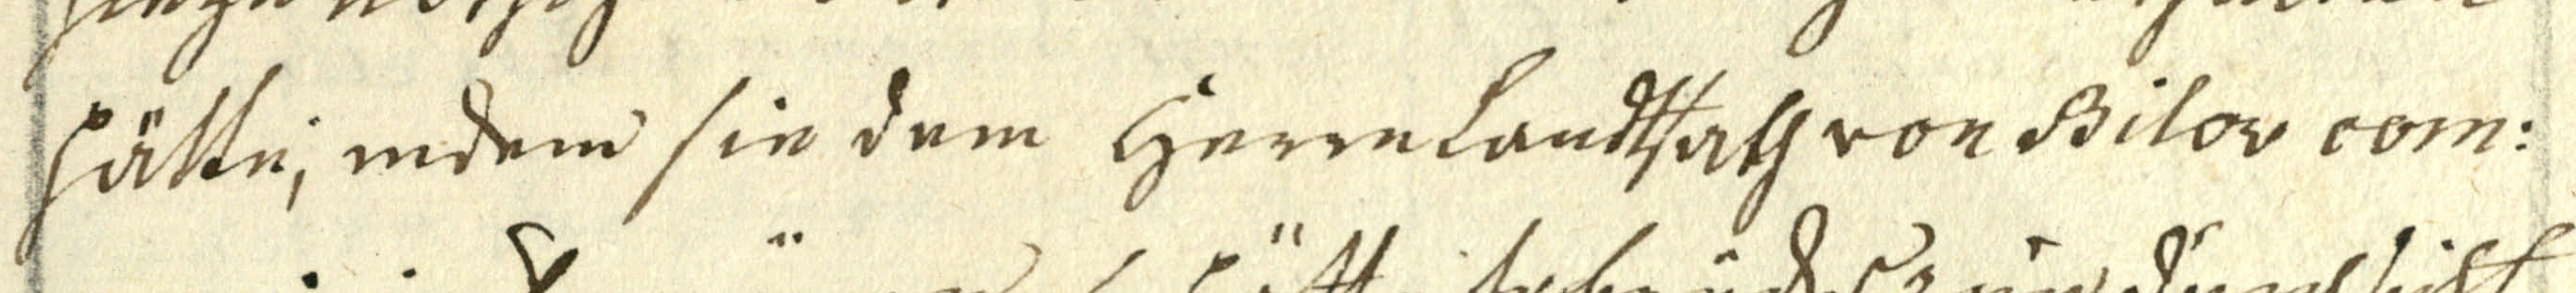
hätte, indem sie dem Herrn LandRath von Bilow com¬
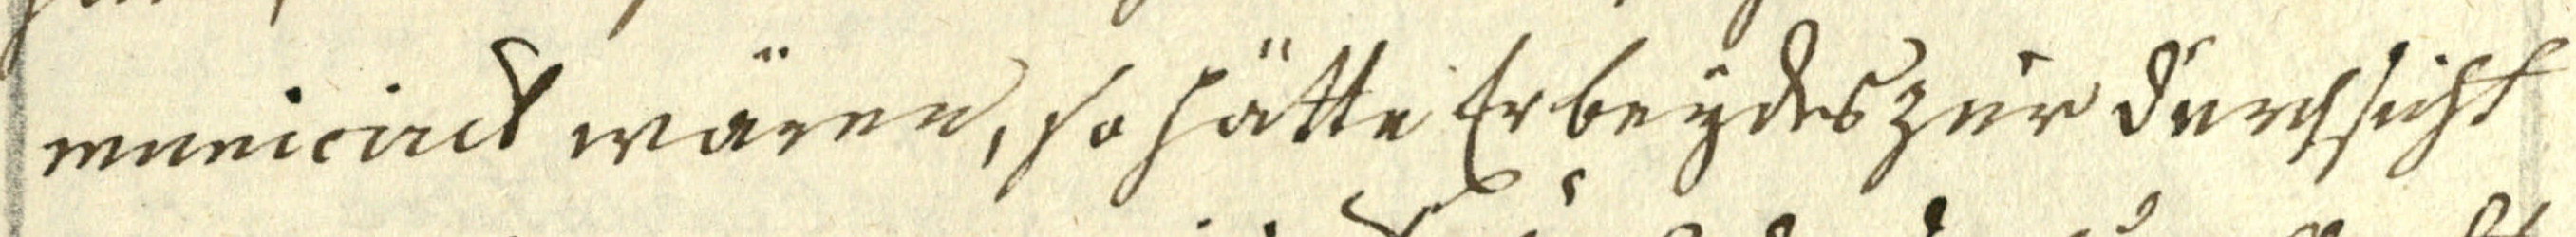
municiret wären, so hätte Er beÿdes zur Durchsicht
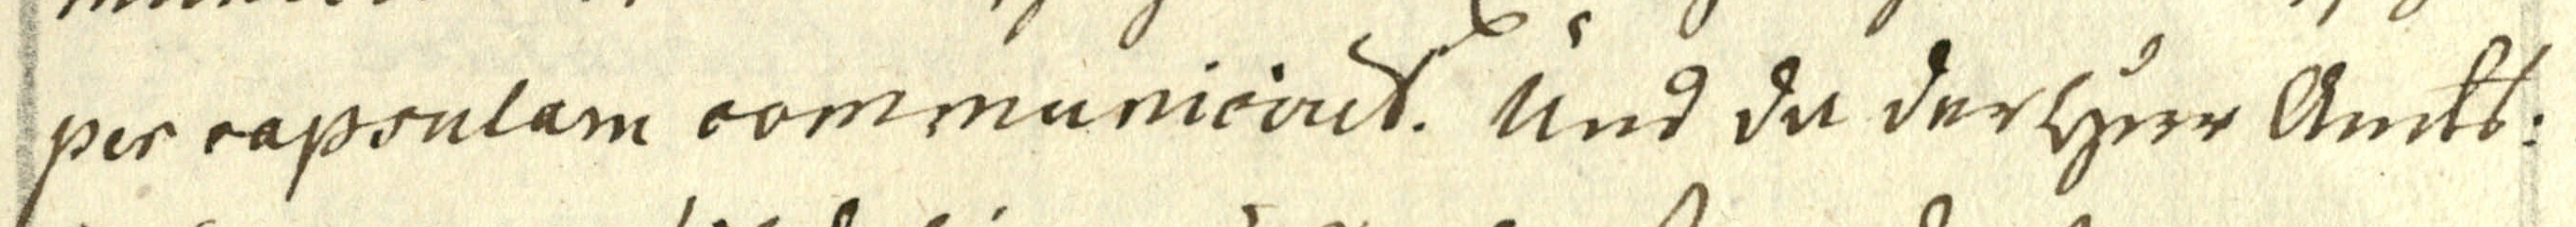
per capsulam communiciret. Und da der Herr Amts¬
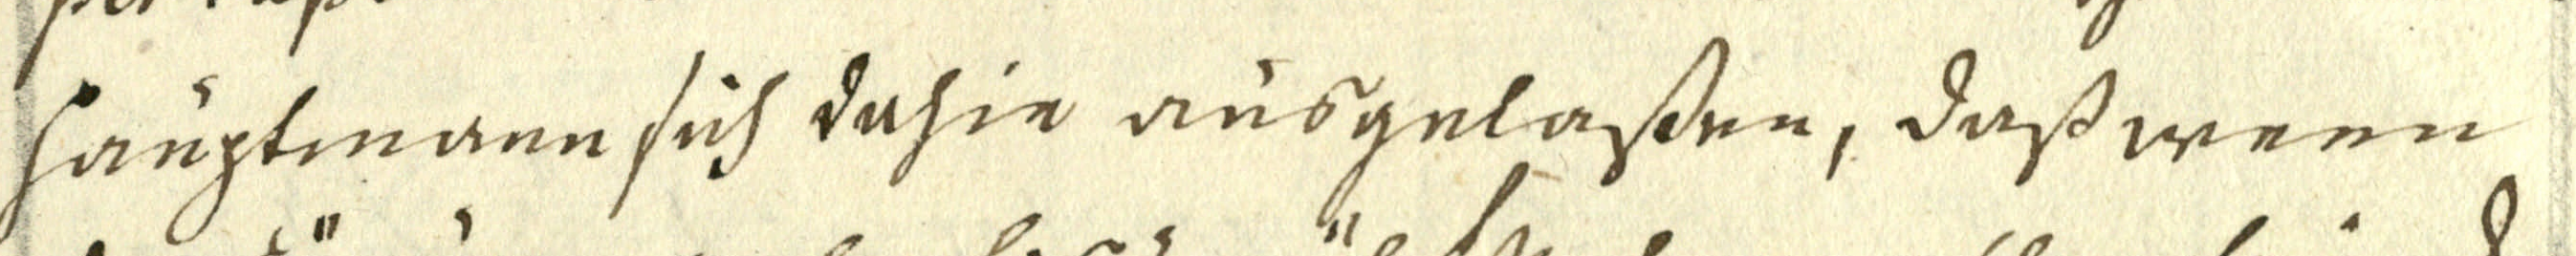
hauptmann sich dahin ausgelaßen, daß wenn
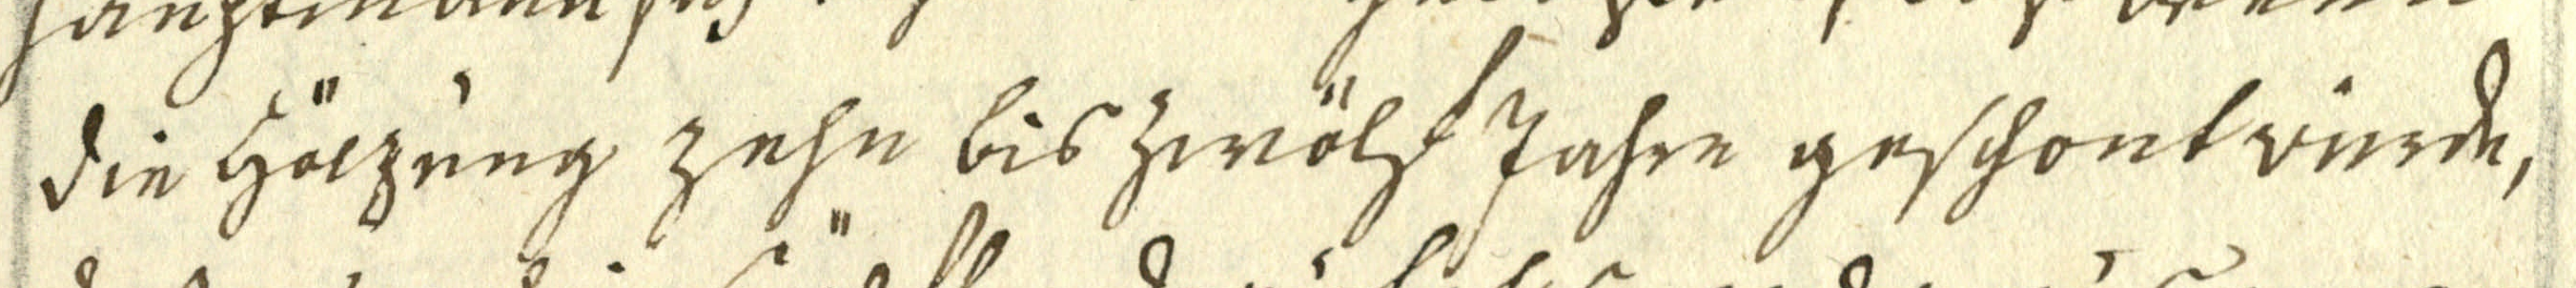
die Hölzung zehn bis zwölf Jahre geschont würde,
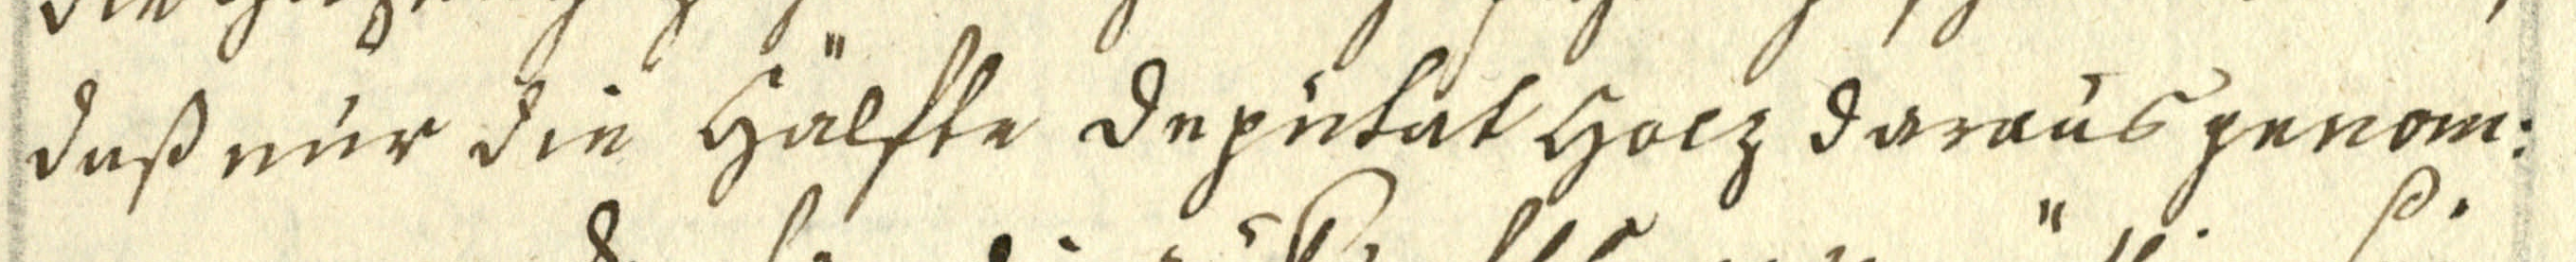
daß nur die Hälfte Deputat Holz daraus genom¬
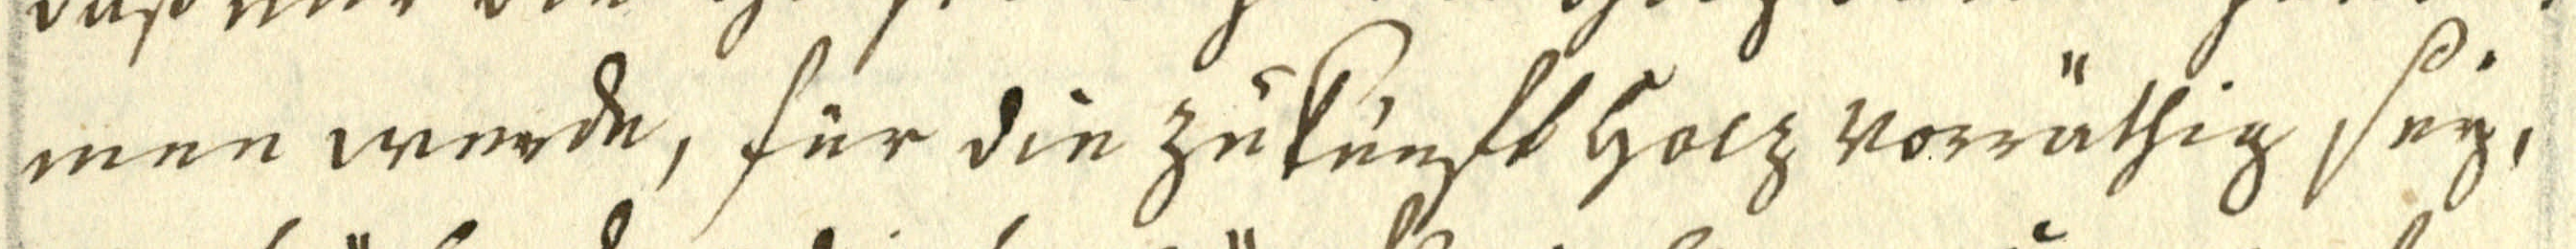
men würde, für die Zukunft Holz vorräthig seÿ,
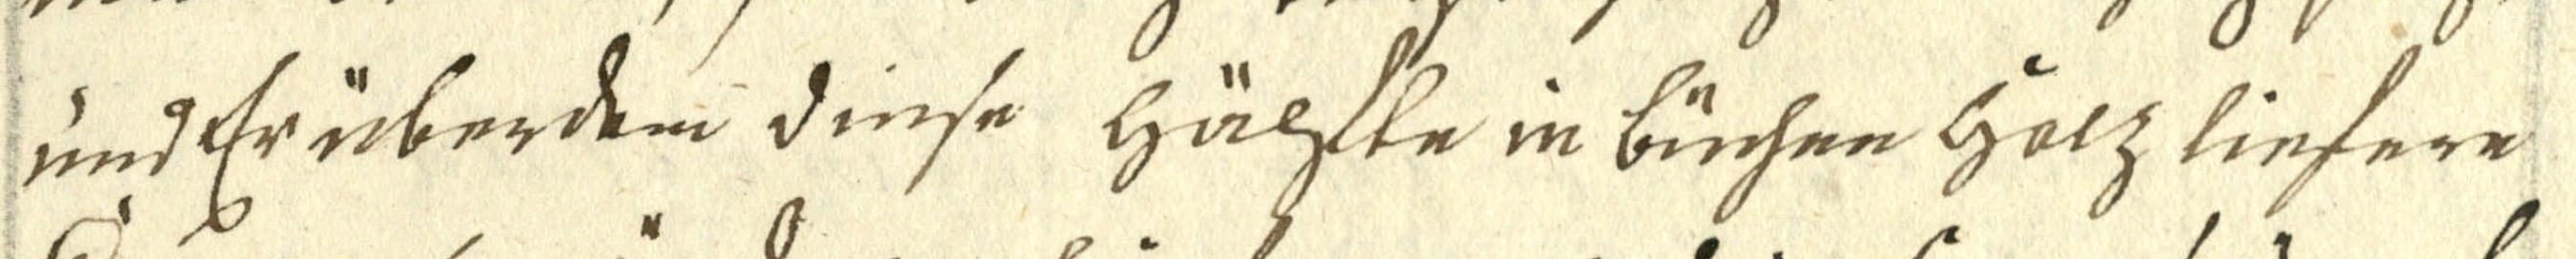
und Er überdem diese Hälfte im Büchen Holz liefern
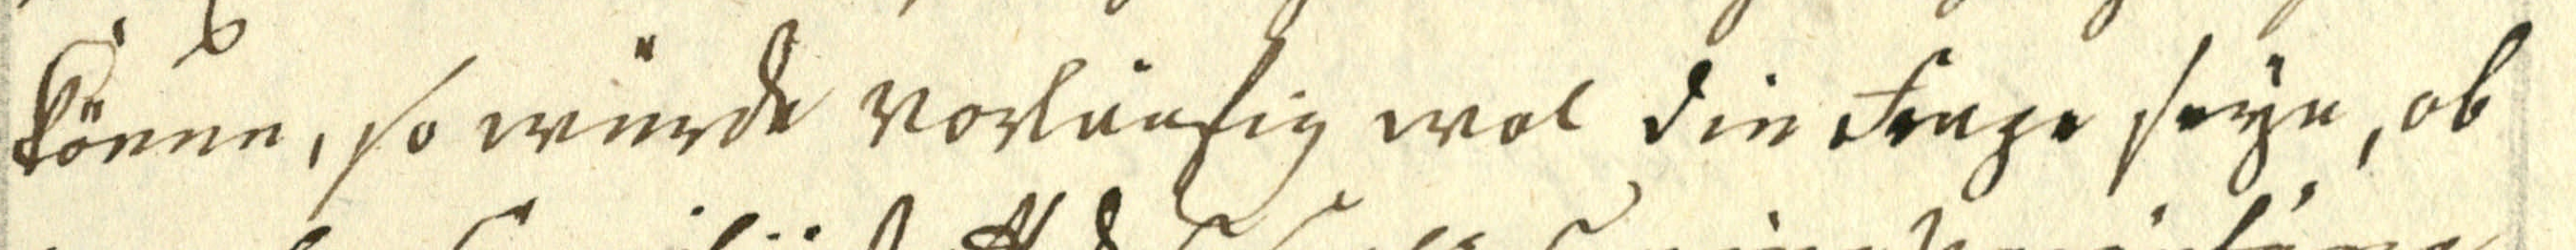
könne, so würde vorläufig wol die Frage seÿn, ob
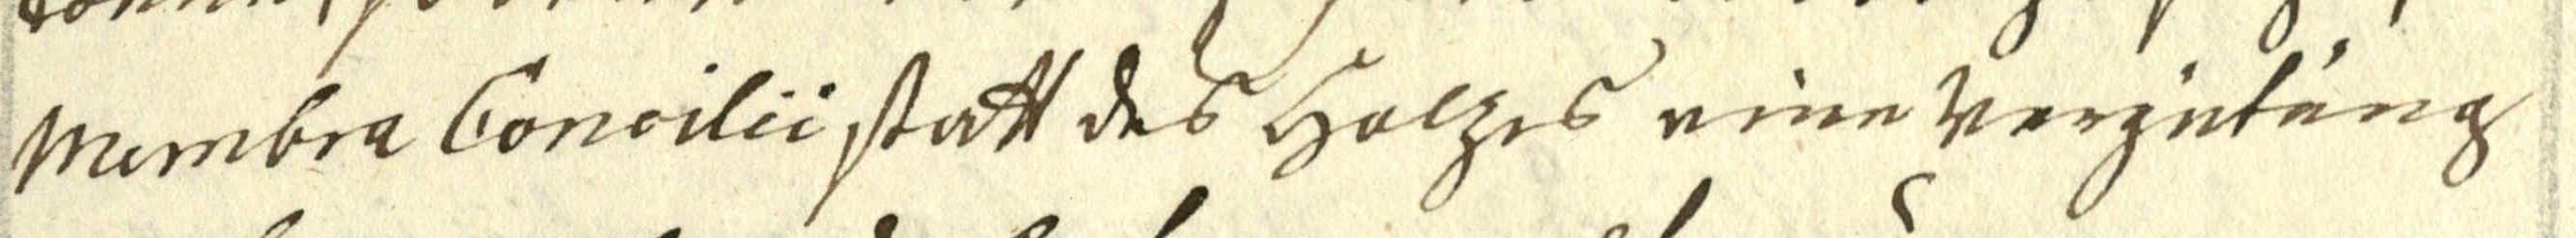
Membra Concilii statt des Holzes eine Vergütung
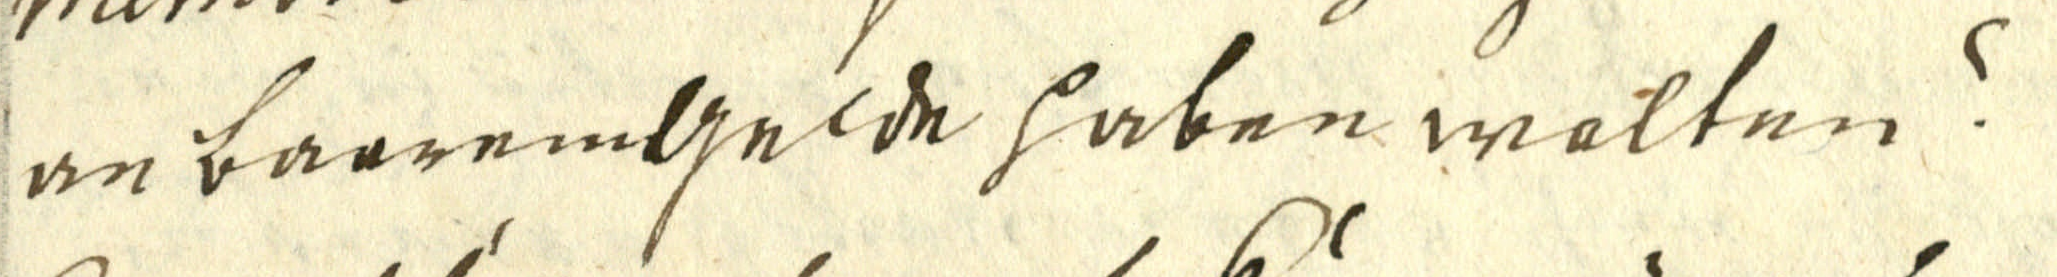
an BaaremGelde haben wolten.
